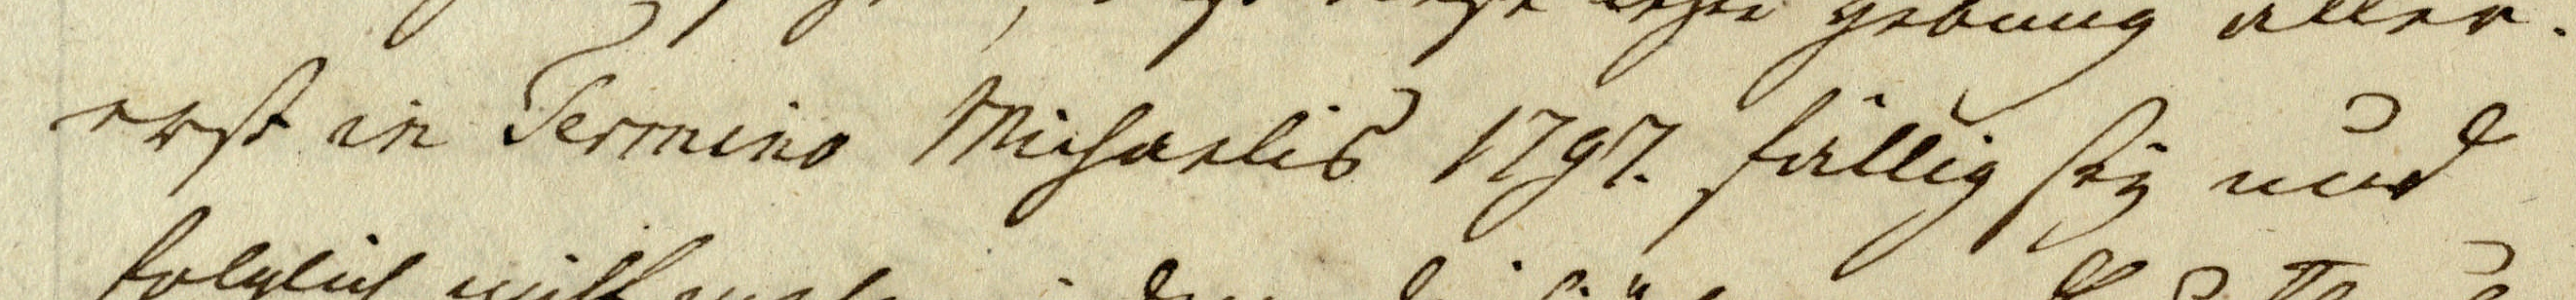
erst in Termino Michaelis 1797. fällig seÿ und
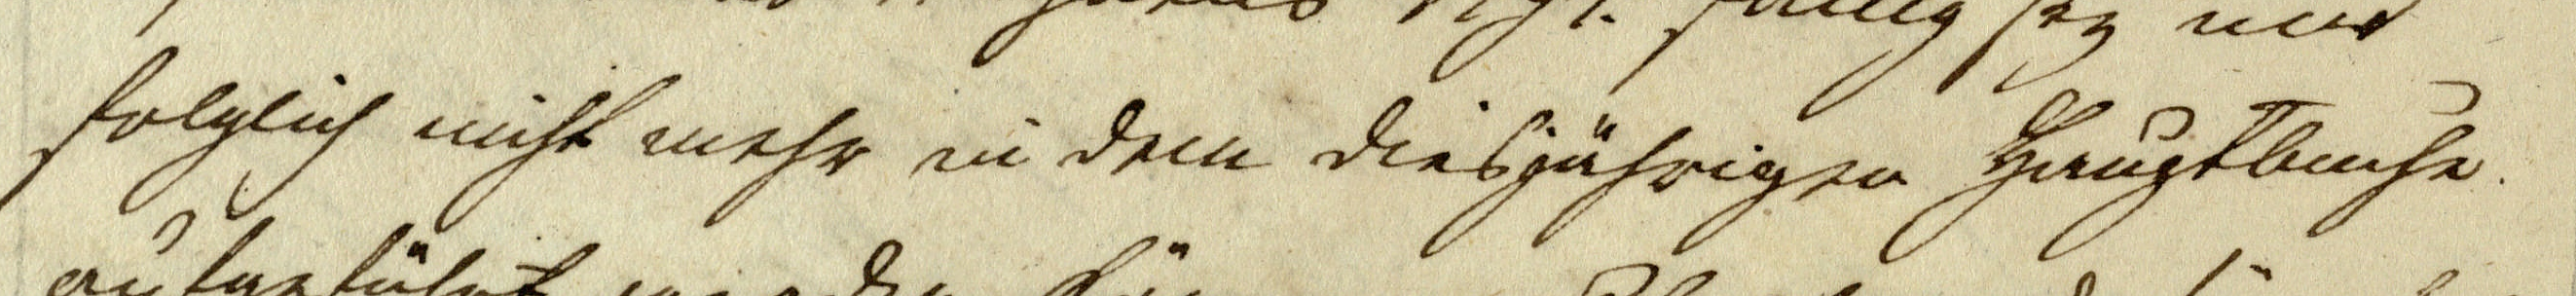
folglich nicht mehr in dem diesjährigen Hauptbuche
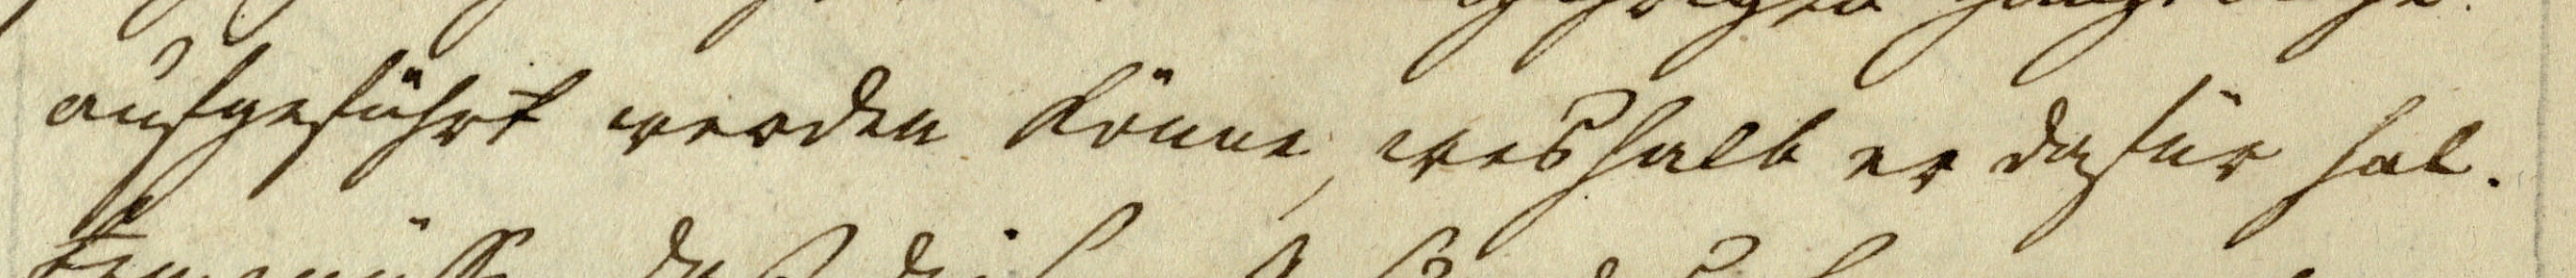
aufgeführt werden könne, weshalb er dafür hal¬
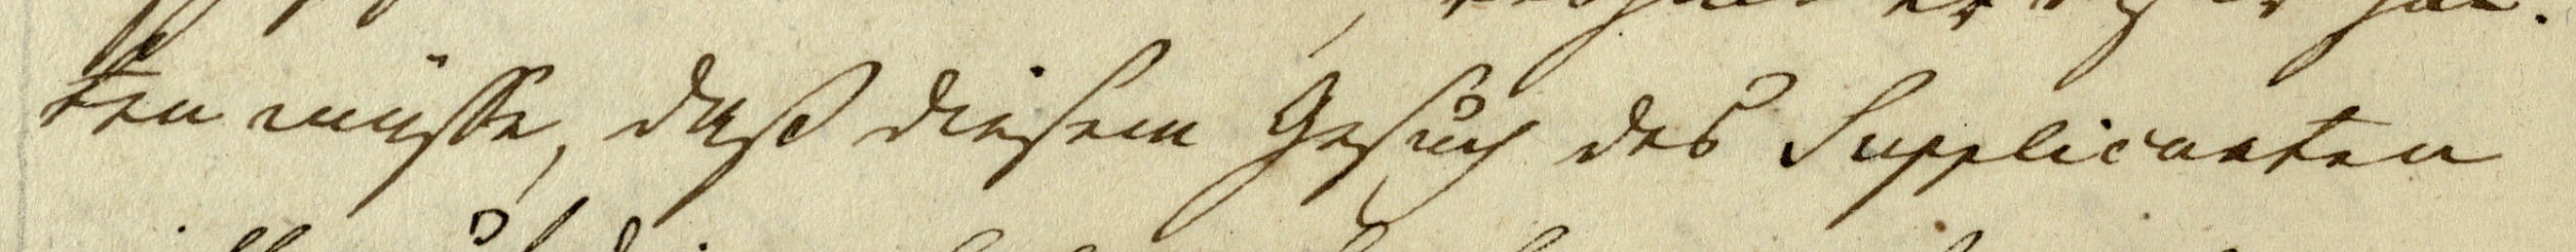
ten müsse, daß diesem Gesuch des Supplicanten
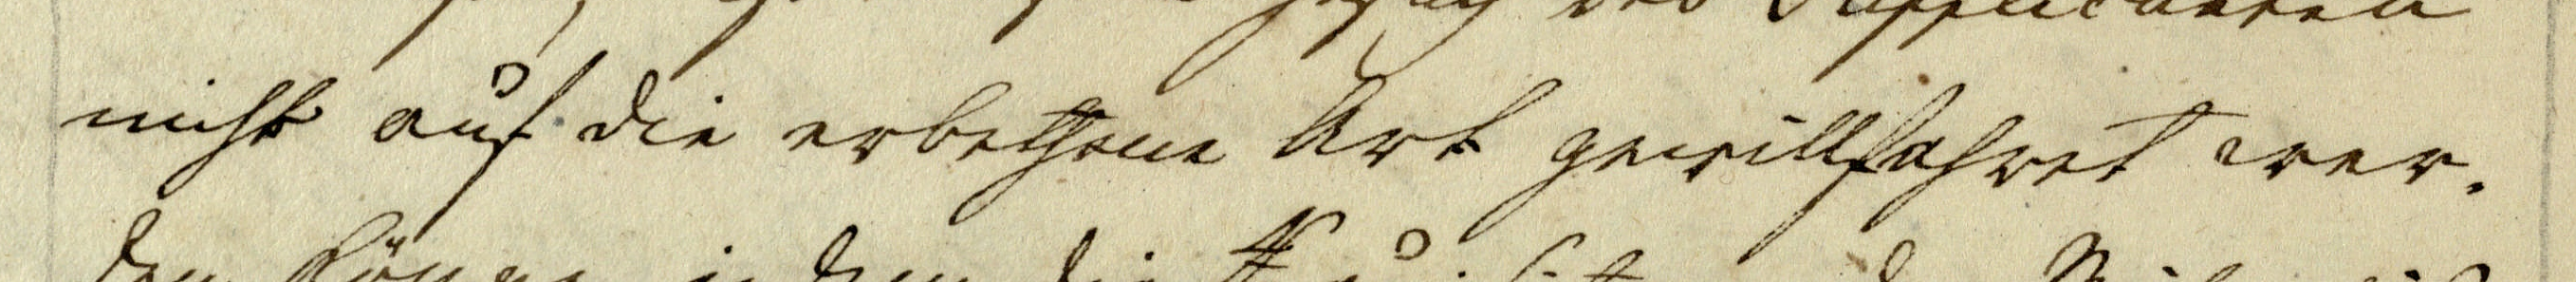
nicht auf die erbethene Art gewillfahret wer¬
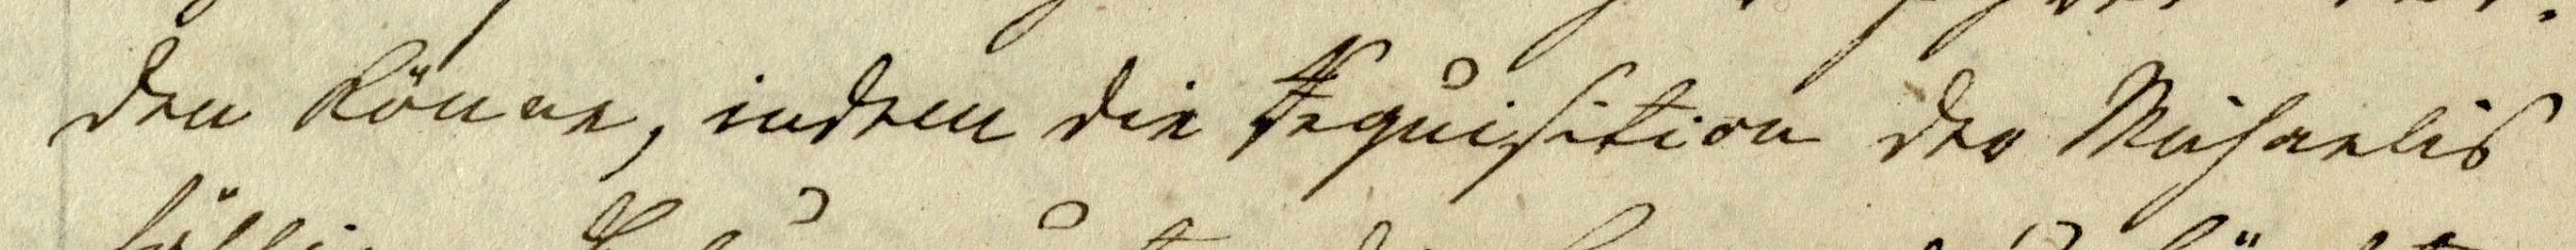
den könne, indem die Requisition der Michaelis
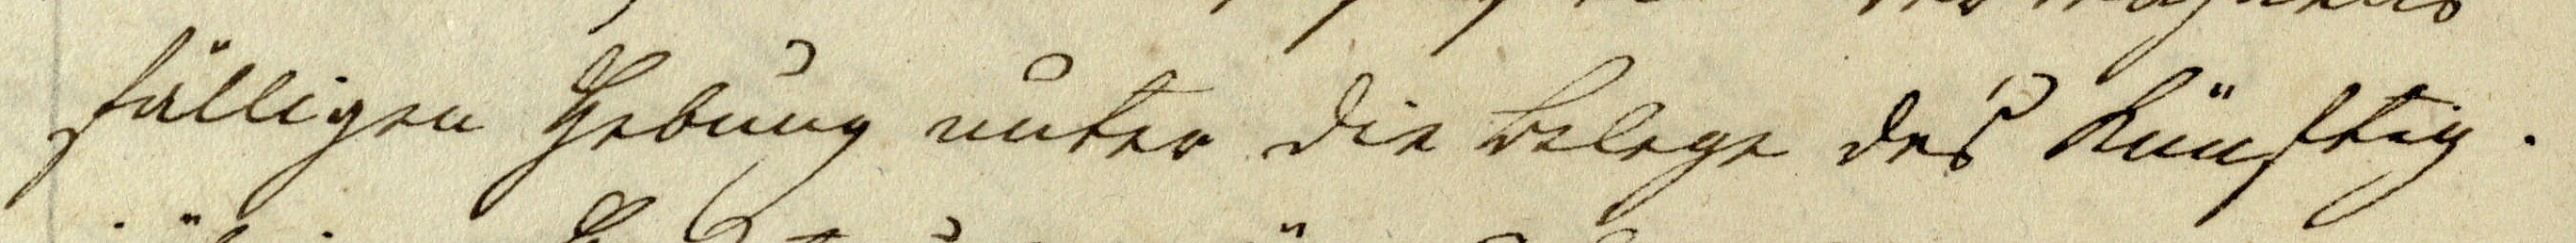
fälligen Hebung unter die Belege des künftig¬
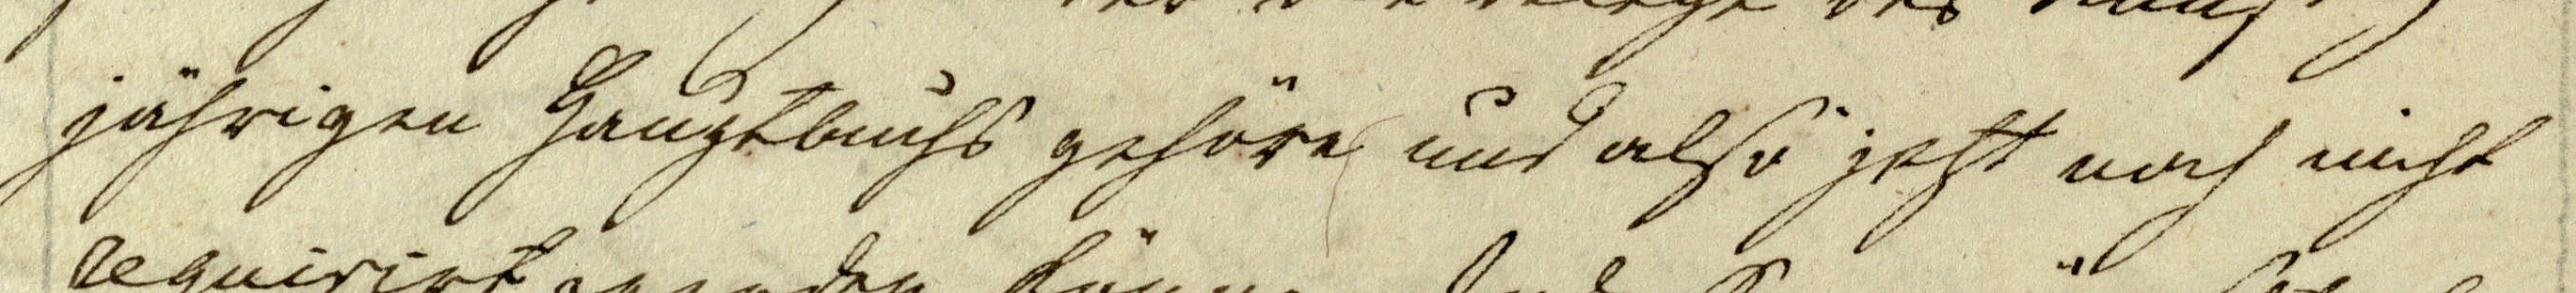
jährigen Hauptbuchs gehöre und also jetzt noch nicht
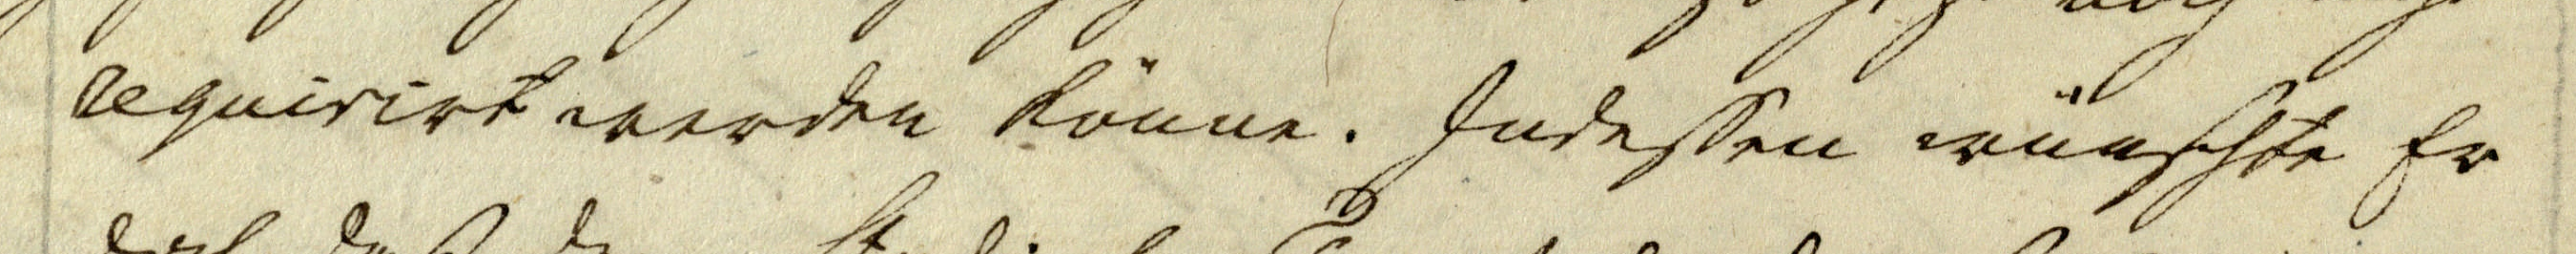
requirirt werden könne. Indessen wünschte Er
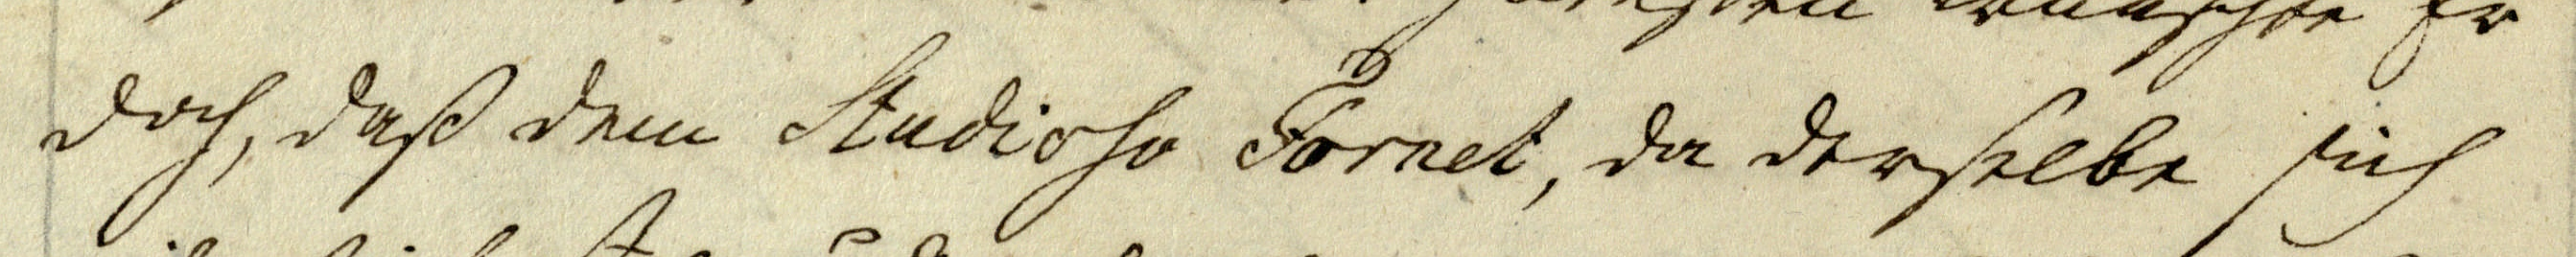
doch, daß dem Studioso Fornet, da derselbe sich
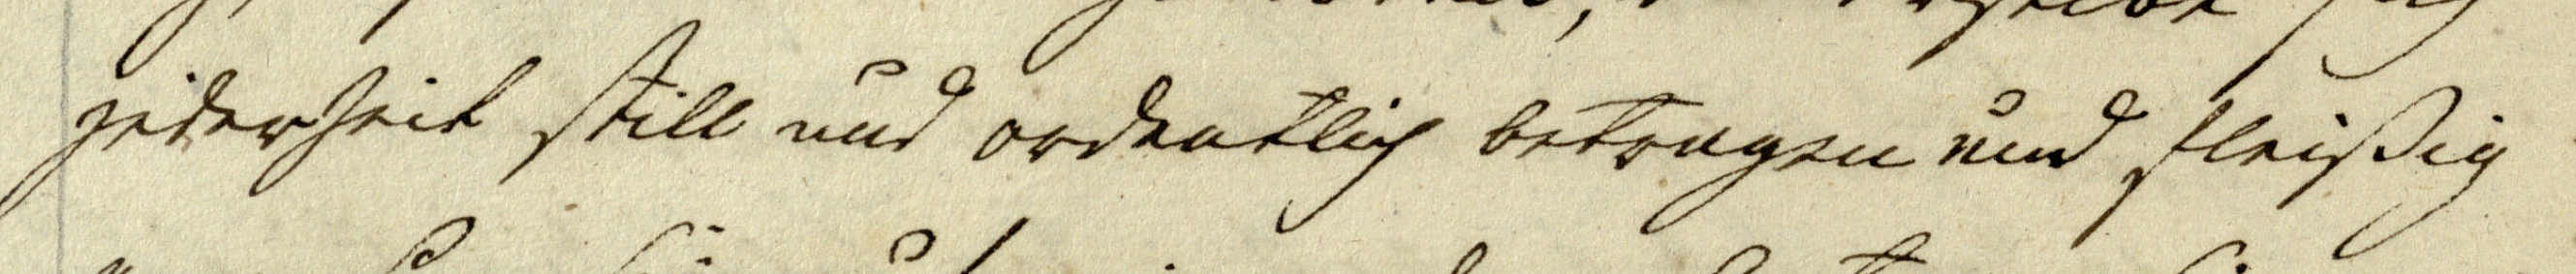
jederzeit still und ordentlich betragen und fleißig
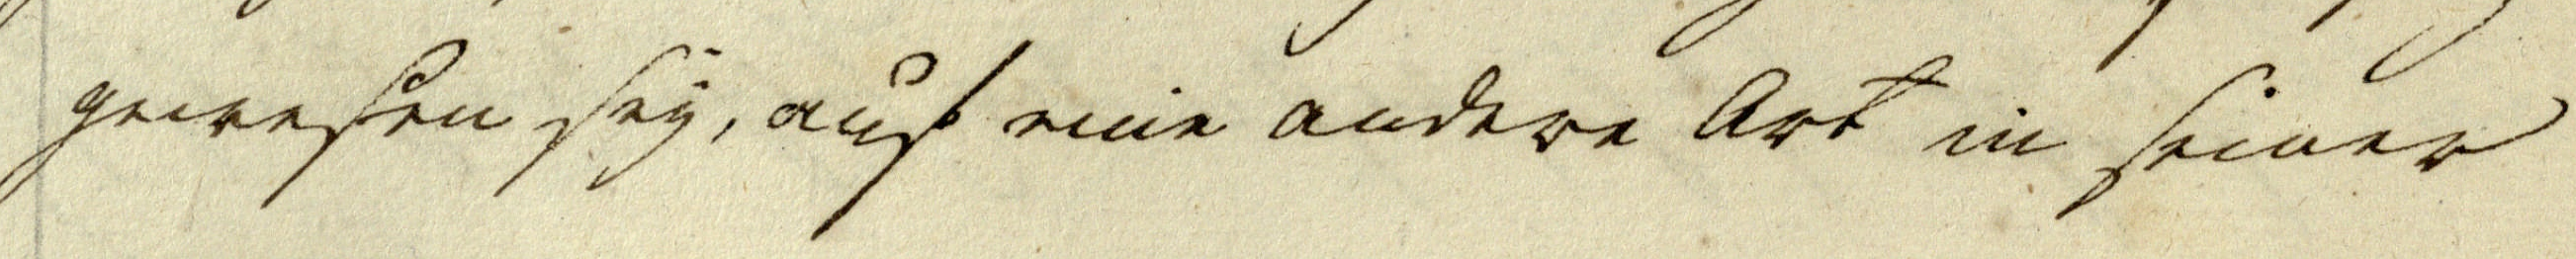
gewesen sey, auf eine andere Art in seiner
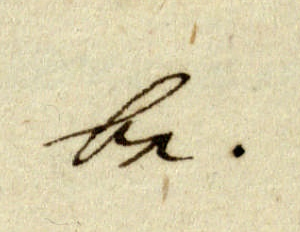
be¬
